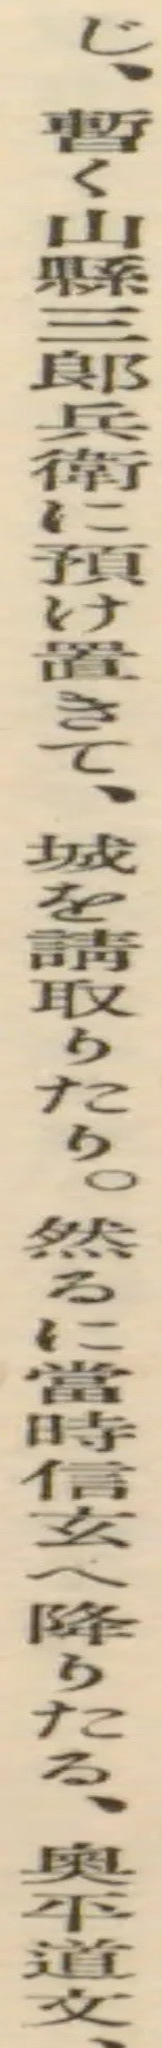じ、暫く山縣三郎兵衛に預け置きて、城を請取りたり。然るに当時信玄へ降りたる、奥平道文、
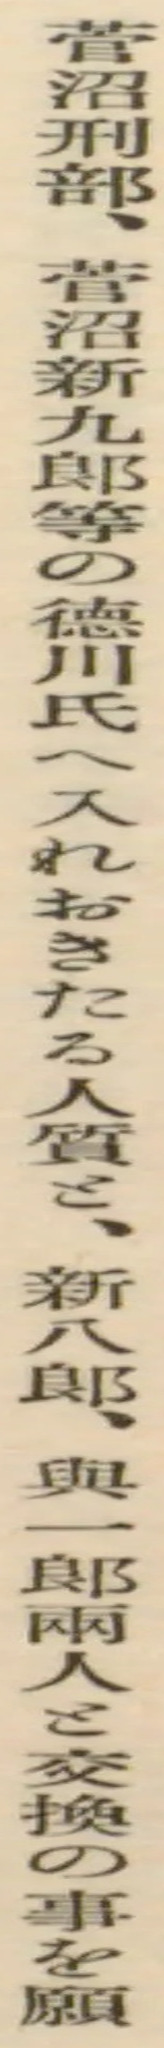菅沼刑部、菅沼新九郎等の徳川氏へ入れおきたる人質と、新八郎、與一郎両人と交換の事を願
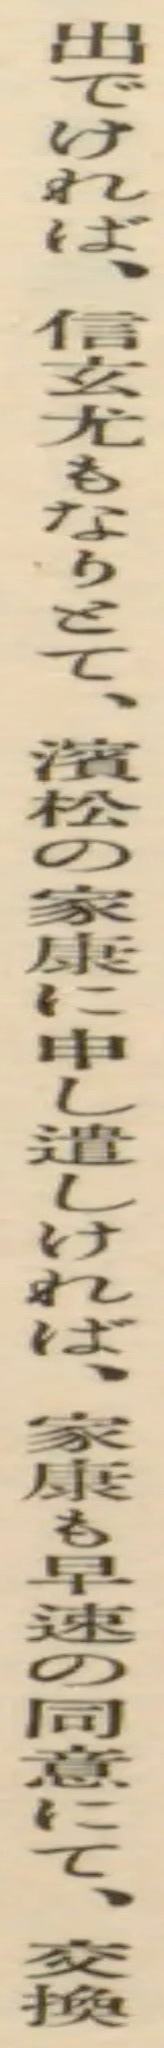出でければ、信玄尤もなりとて、浜松の家康に申し遣しければ、家康も早速の同意にて、交換
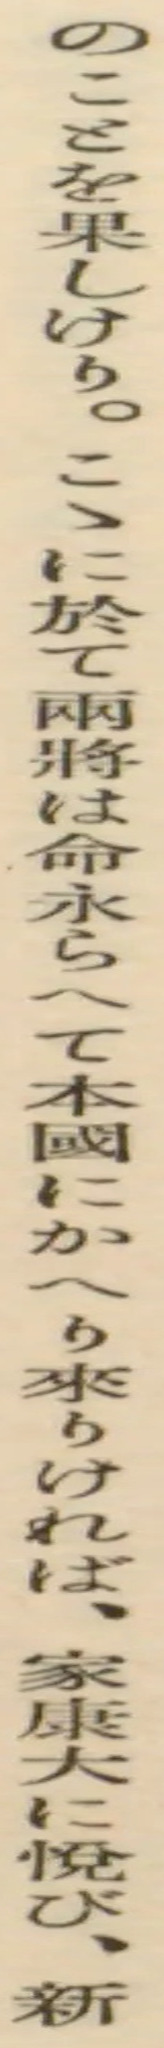のことを果しけり。こゝに於て両将は命永らへて本国にかへり来りければ、家康大に悦び、新
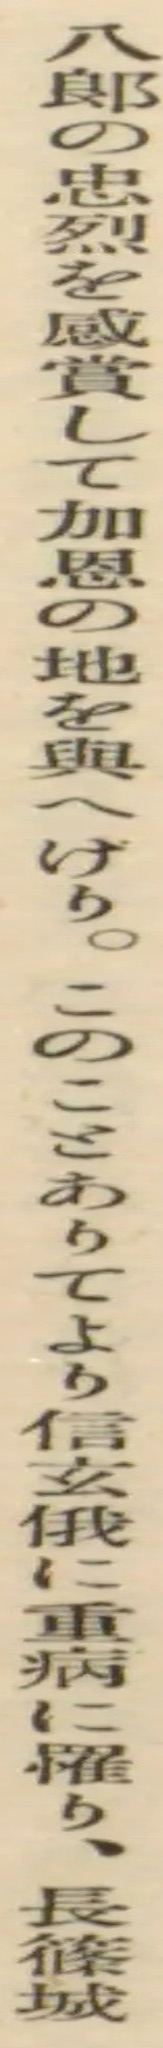八郎の忠烈を感賞して加恩の地を与へけり。このことありてより信玄俄に重病に罹り、長篠城

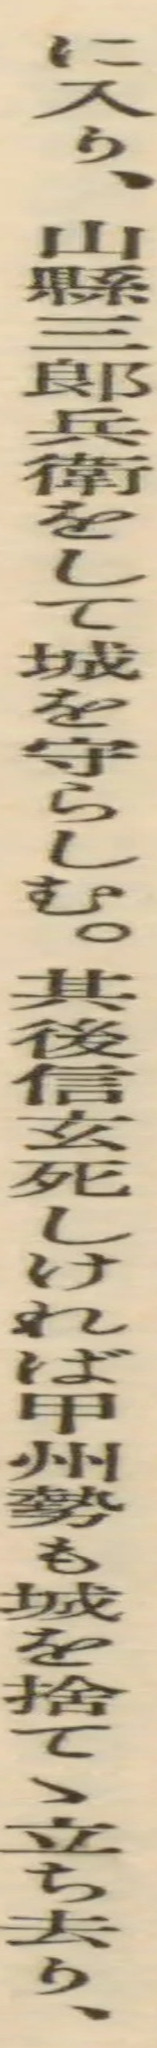に入り、山縣三郎兵衛をして城を守らしむ。其後信玄死しければ甲州勢も城を捨てゝ立ち去り、
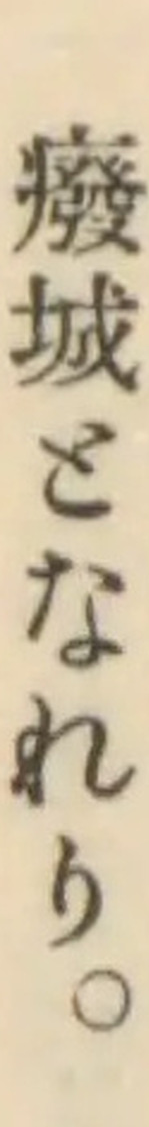廃城となれり。
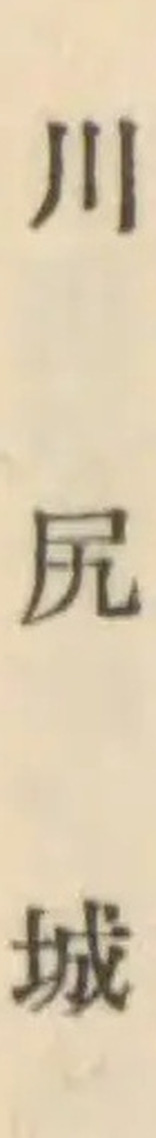川尻城
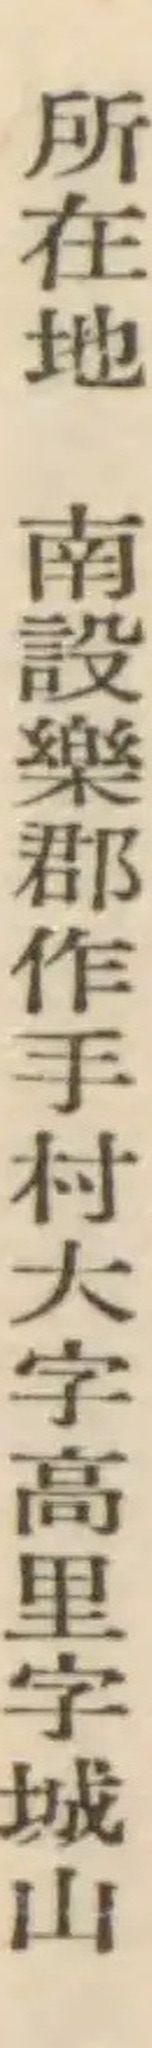所在地南設楽郡作手村大字高里城山
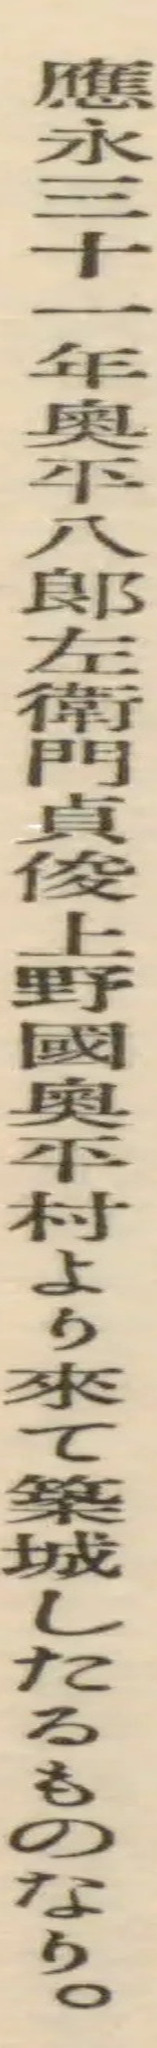応永三十一年奥平八郎左衛門貞俊上野国奥平村より来て築城したるものなり。
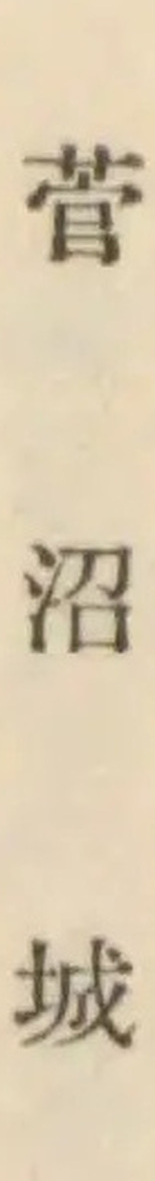菅沼城
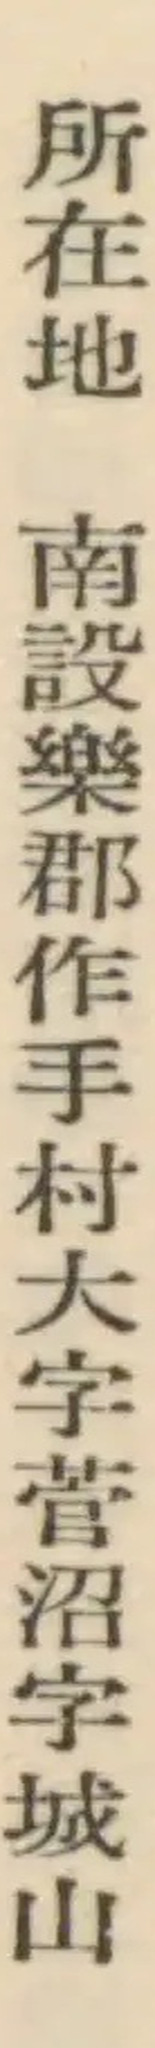所在地南設楽郡作手村大字菅沼城山
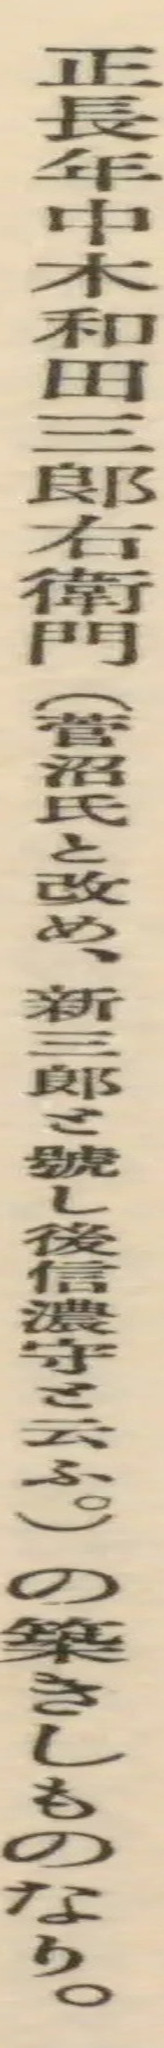生長年中木和田三郎右衛門(菅沼氏と改め、新三郎と号し後信濃守と云ふ。)の築きしものなり。
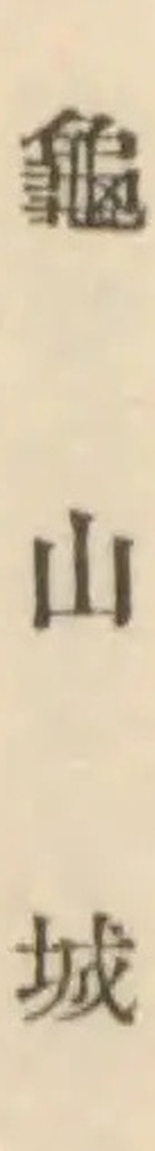亀山城
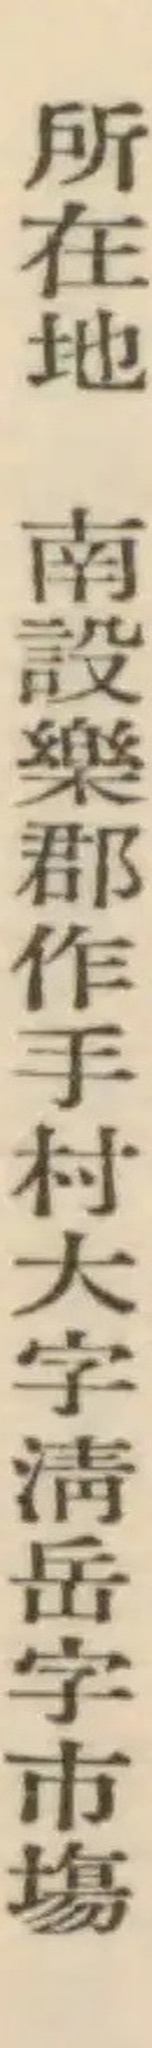所在地南設楽郡作手村大字清岳字市場
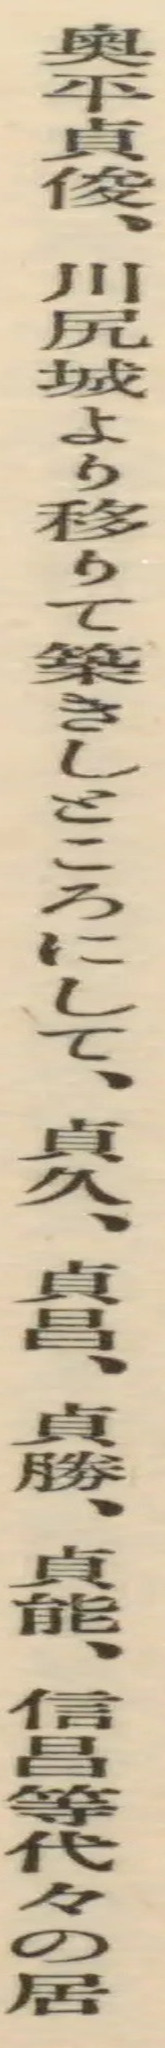奥平貞俊、川尻城より移りて築きしところにして、貞久、貞昌、貞勝、貞能、信昌等代々の居
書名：東三河之古城
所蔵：国立国会図書館 National Diet Library, JAPAN
